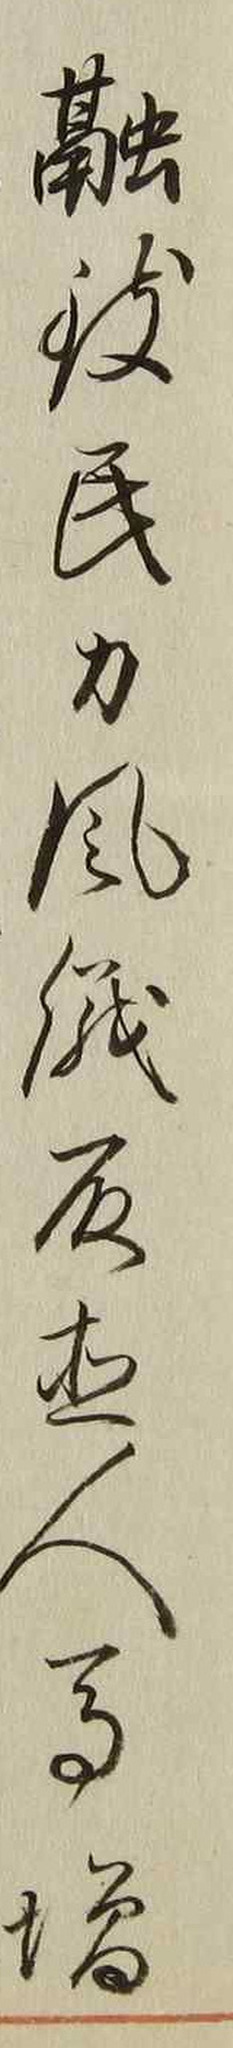融致民カ風儀取直人馬増
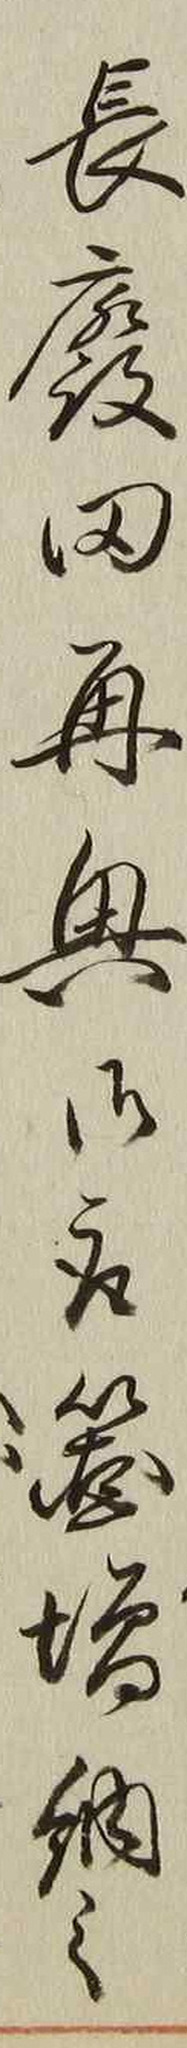長廃田再興御取箇増納之
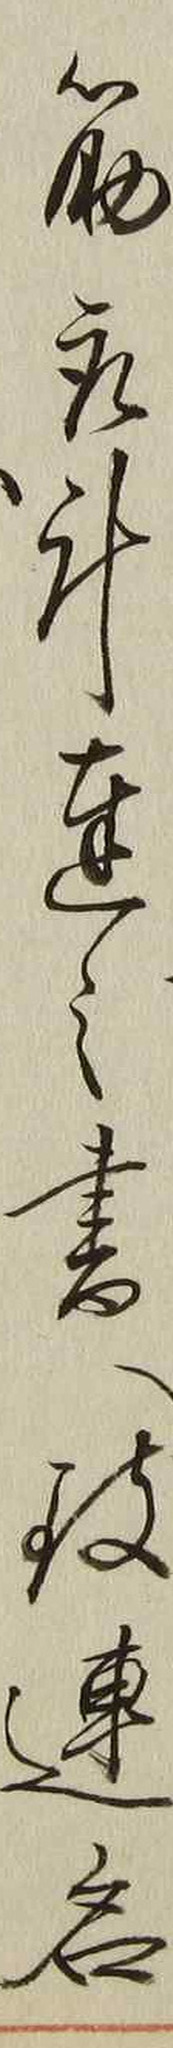筋取計達之書へ致連名
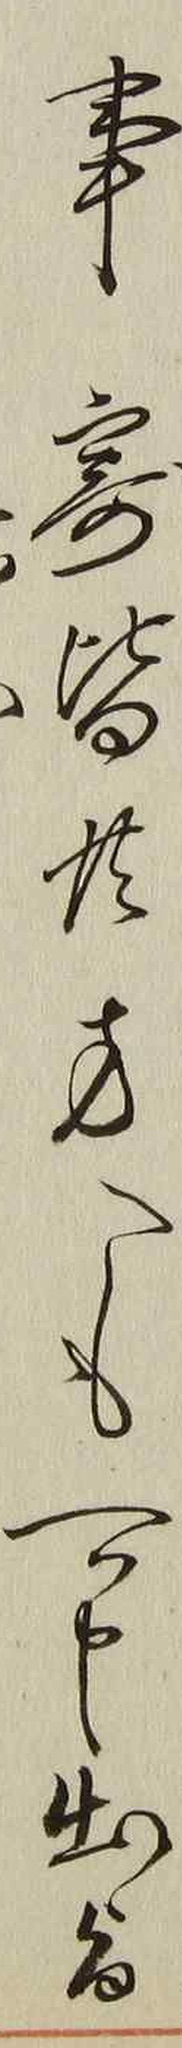事寄皆方へも可申出旨
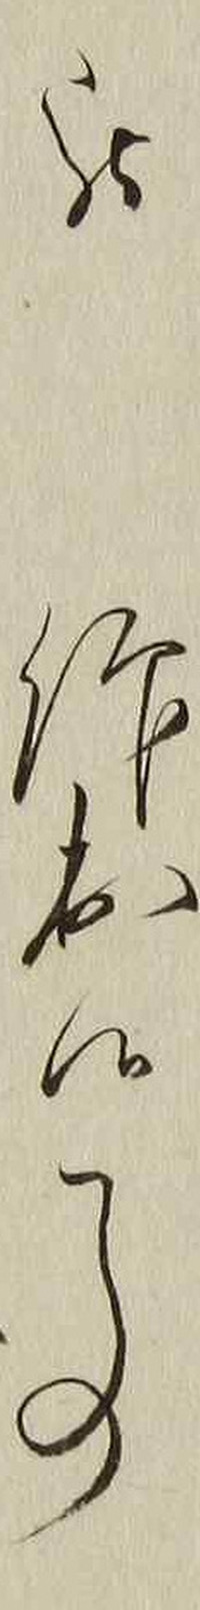被仰出候事
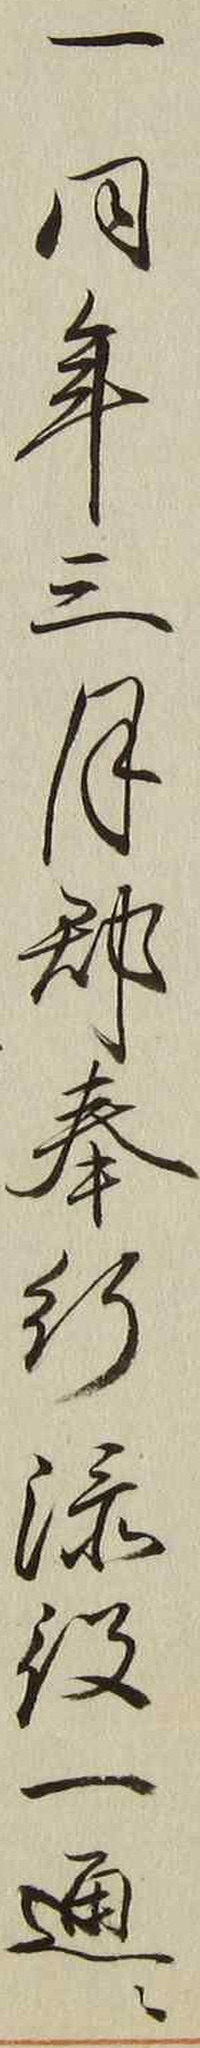一同年三月郡奉行添役一通ニ
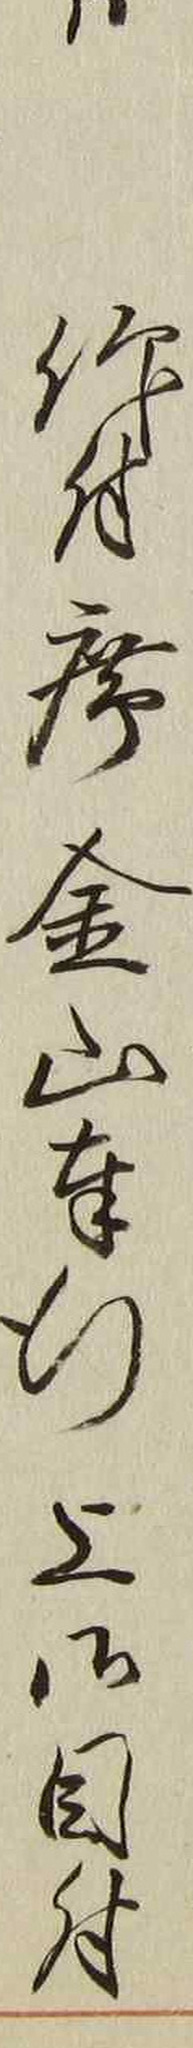被仰付金山奉行上御目付
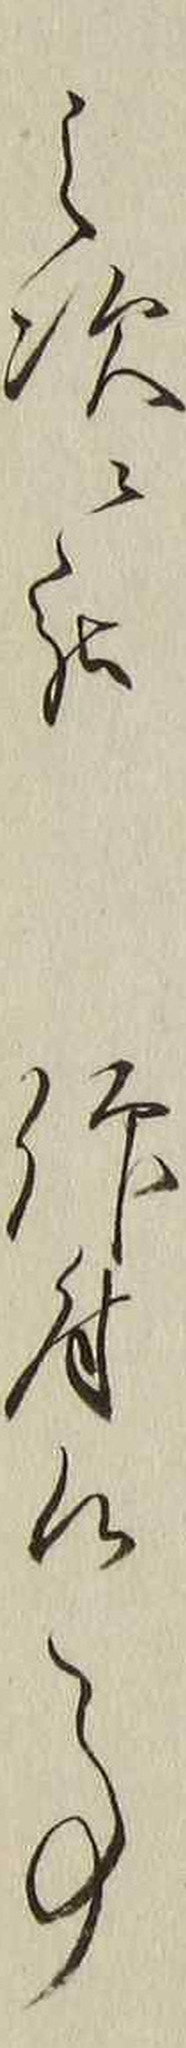之次ニ被仰付候事
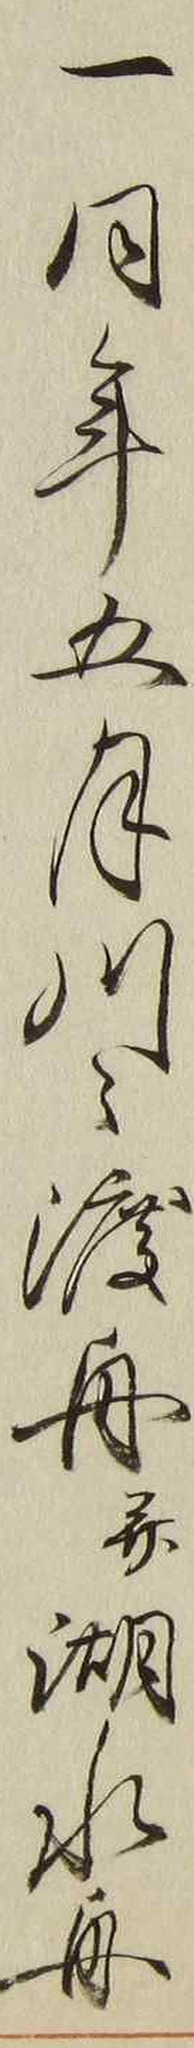一同年五月川々渡舟并湖水舟
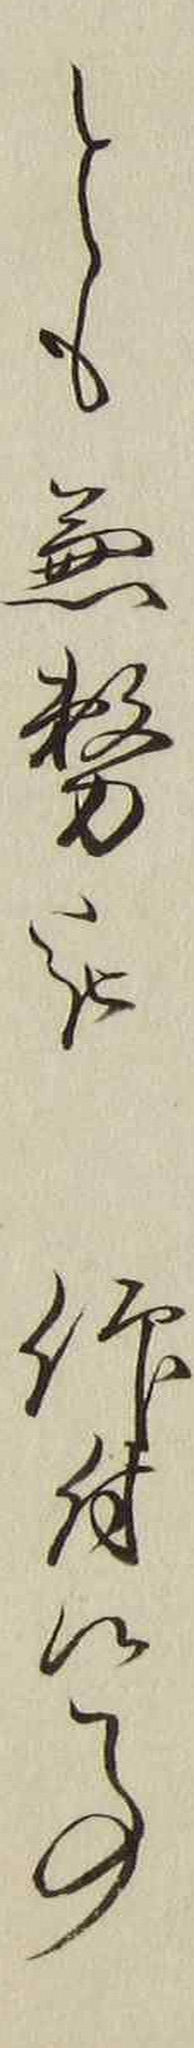とも兼務被仰付候事

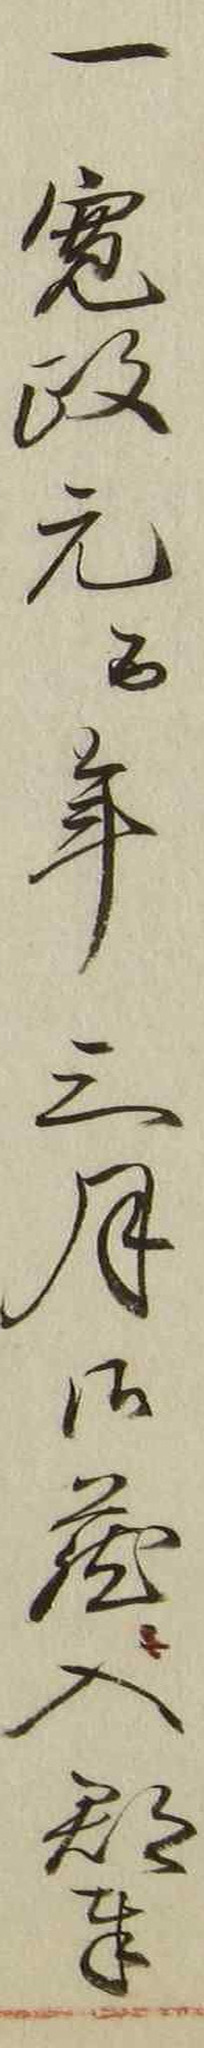一寛政元酉年三月御蔵ニ入郡奉
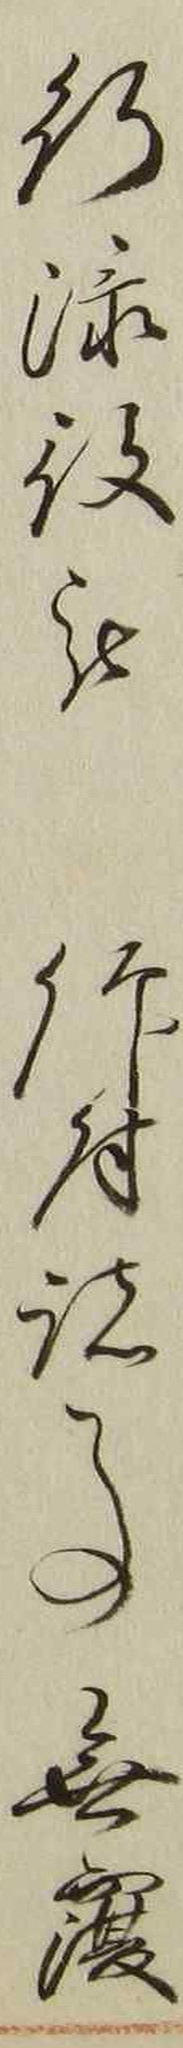行添役被仰付諸事無覆
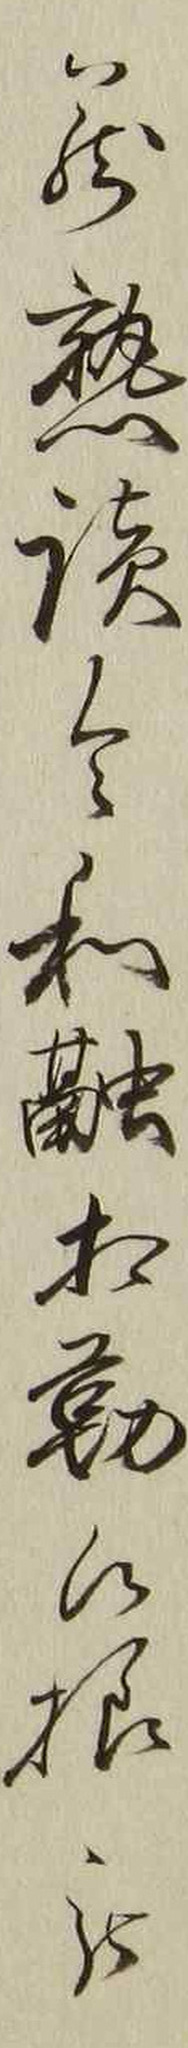蔵熟談令和融相勤候様被
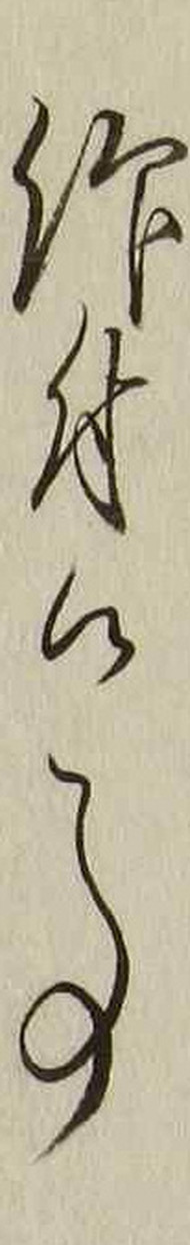仰付候事
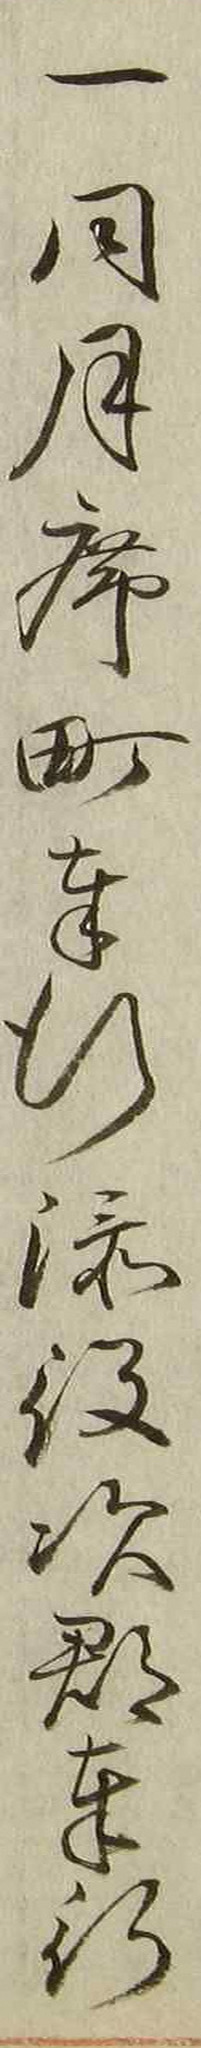一同月席奉行添役次郡奉行
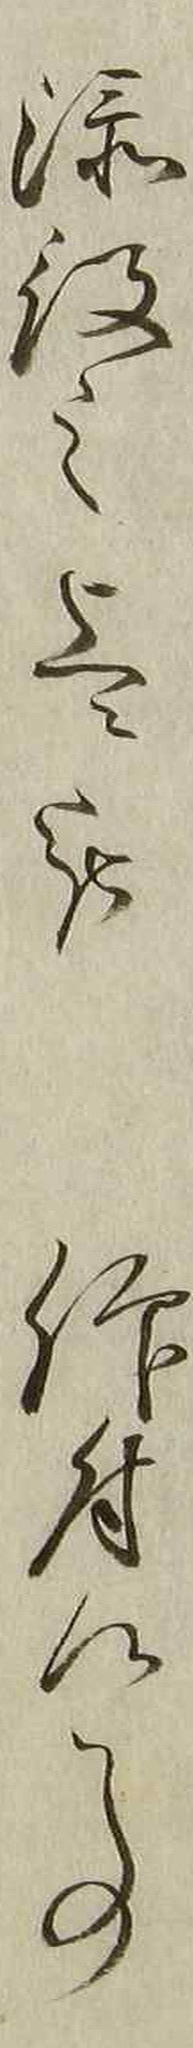添役之上ニ被仰付候事
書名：諸士系譜　巻之54　ほ之部1
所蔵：会津若松市立会津図書館
